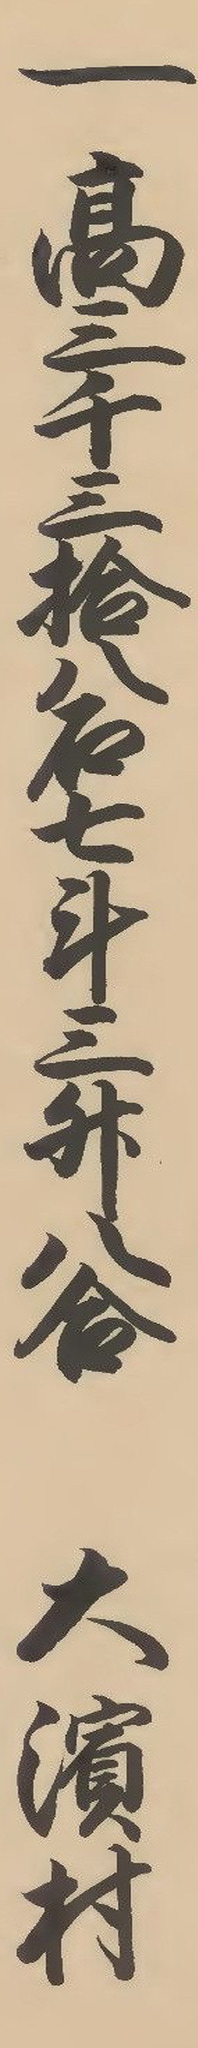一高三千三拾八石七斗三升八合大浜村
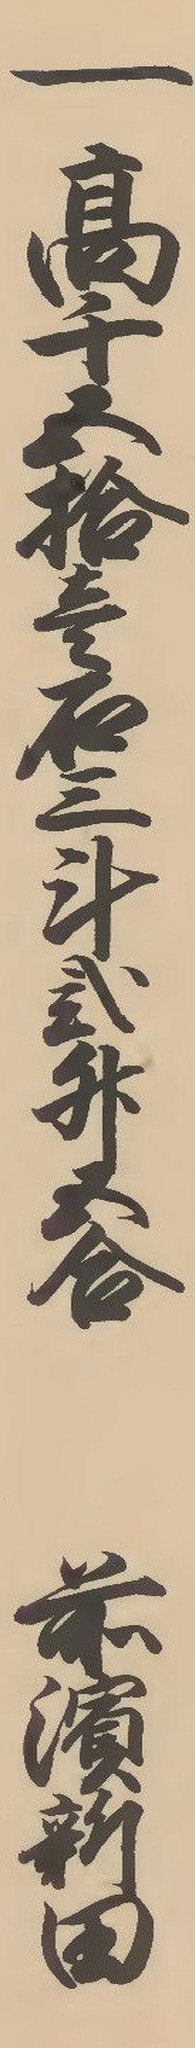一高千五拾壱石三斗弐升五合前浜新田
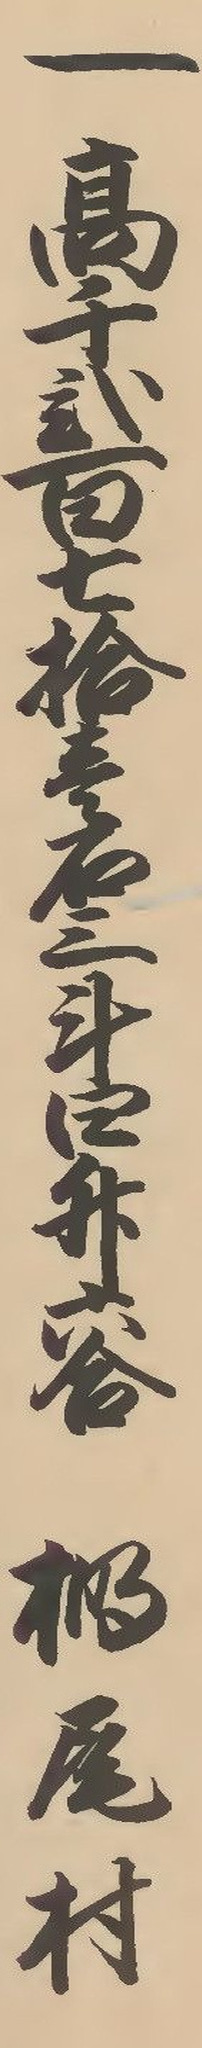一高千弐百七拾壱石三斗四升六合棚尾村
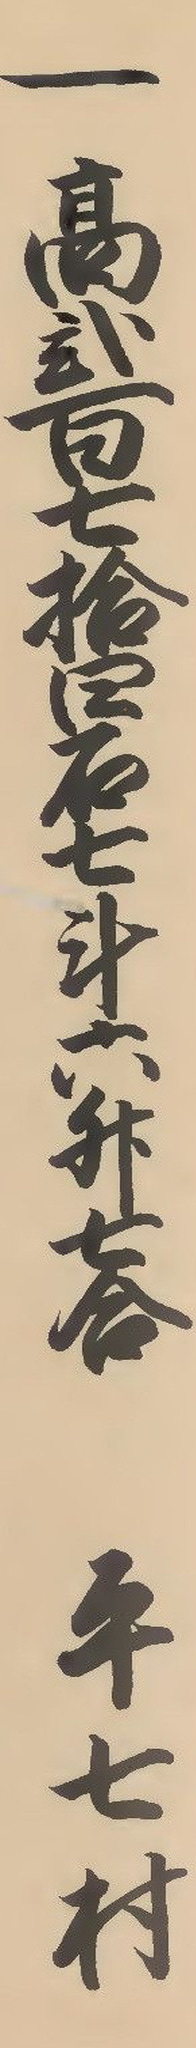一高弐百七拾四石七斗六升七合平七村
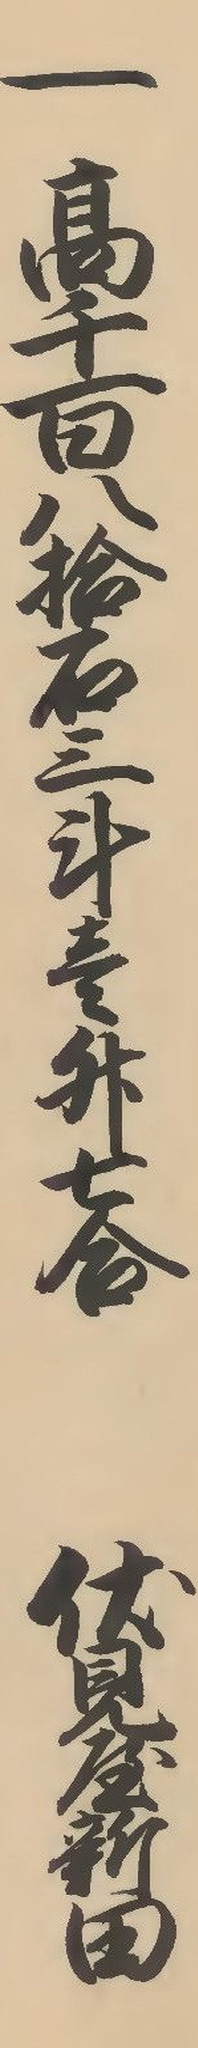一高千百八拾石三斗壱升七合伏見屋新田
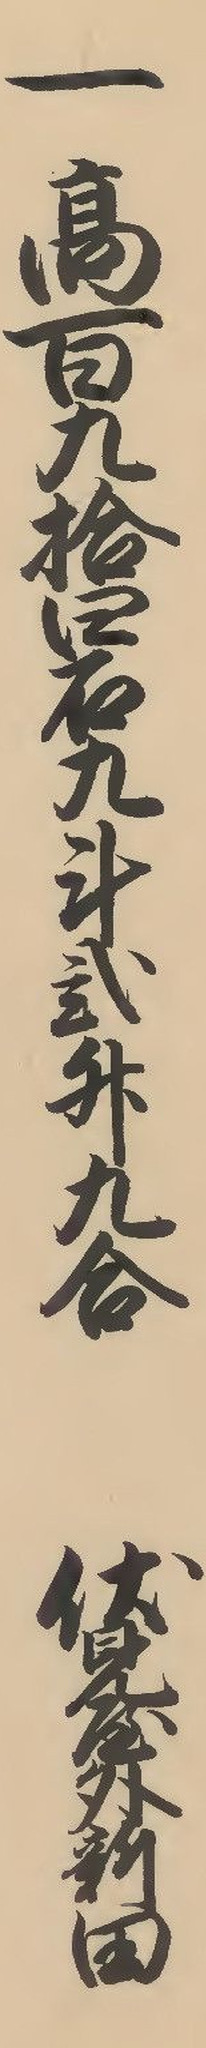一高百九拾四石九斗弐升九合伏見屋外新田
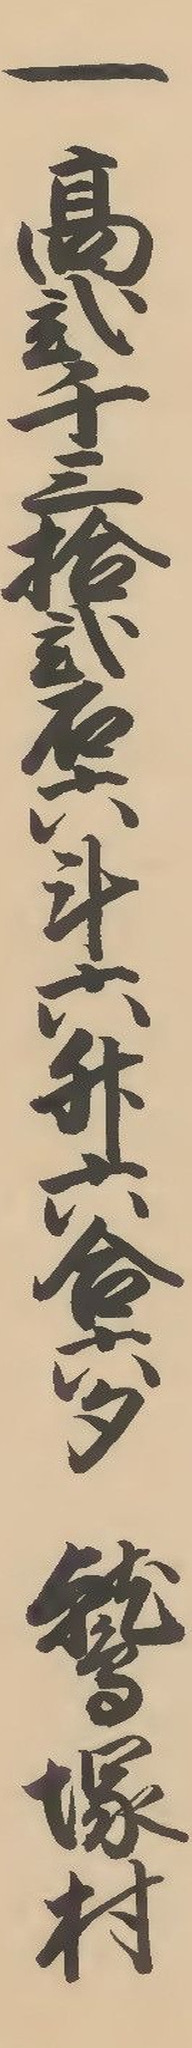一高弐千三拾弐石六斗六升六合六勺鷲塚村

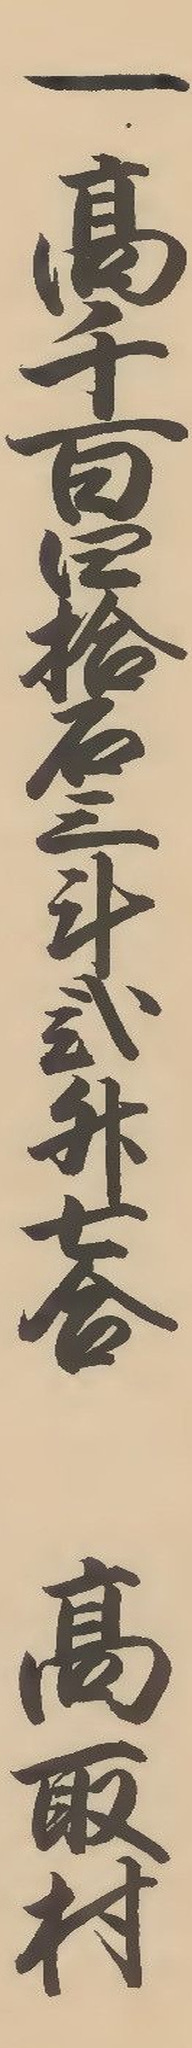一高千百四拾石三斗弐升七合高取村
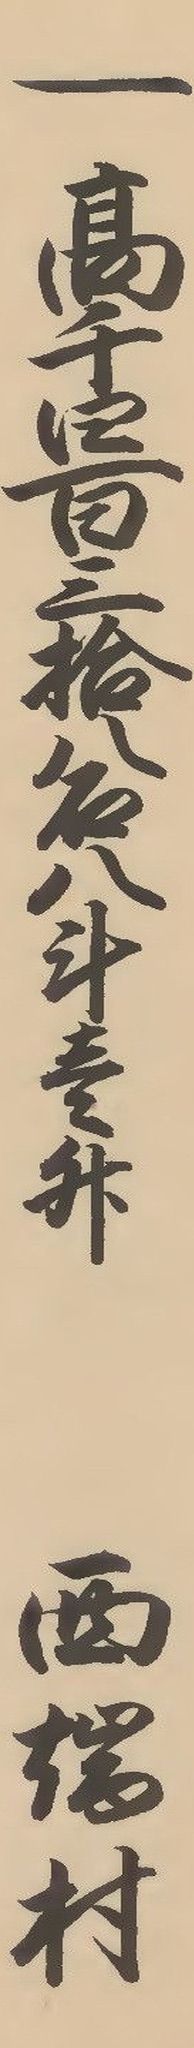一高千四百三拾八石八斗壱升西端村
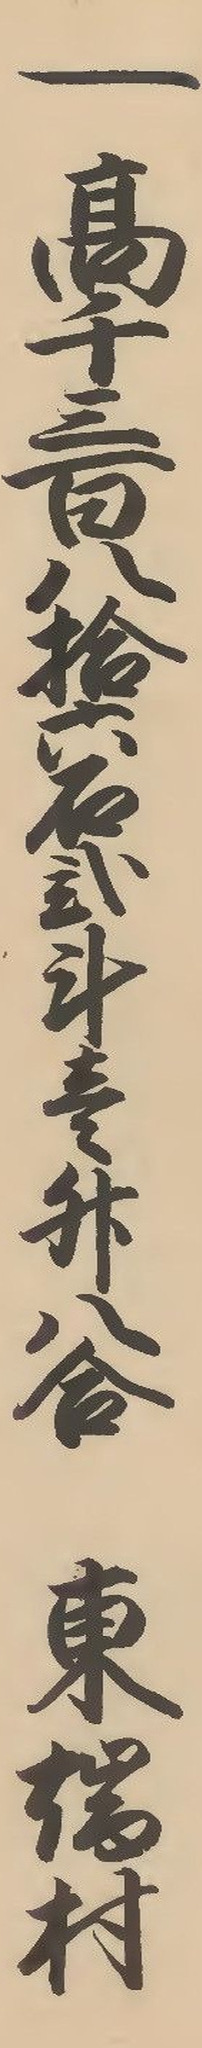一高千三百八拾六石弐斗壱升八合東端村
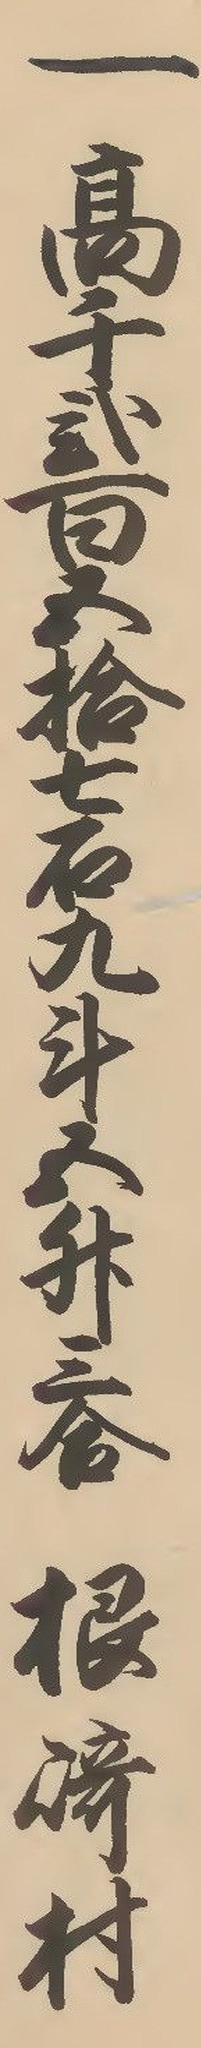一高千弐百五拾七石九斗五升三合根崎村
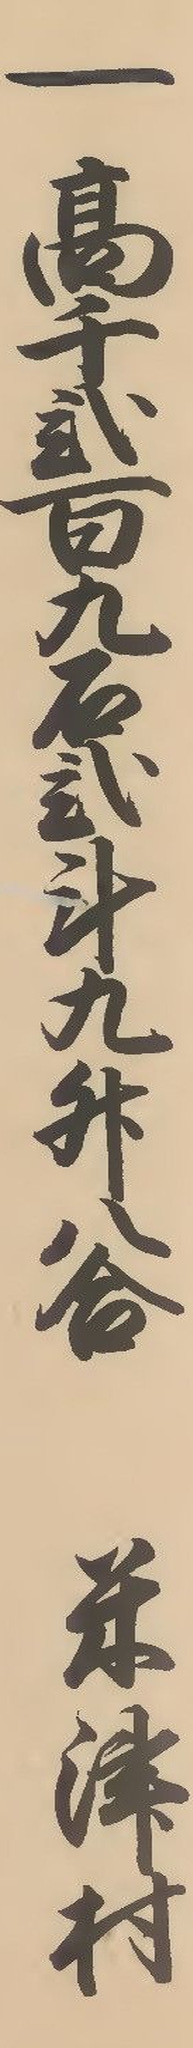一高千弐百九石弐斗九升八合米津村
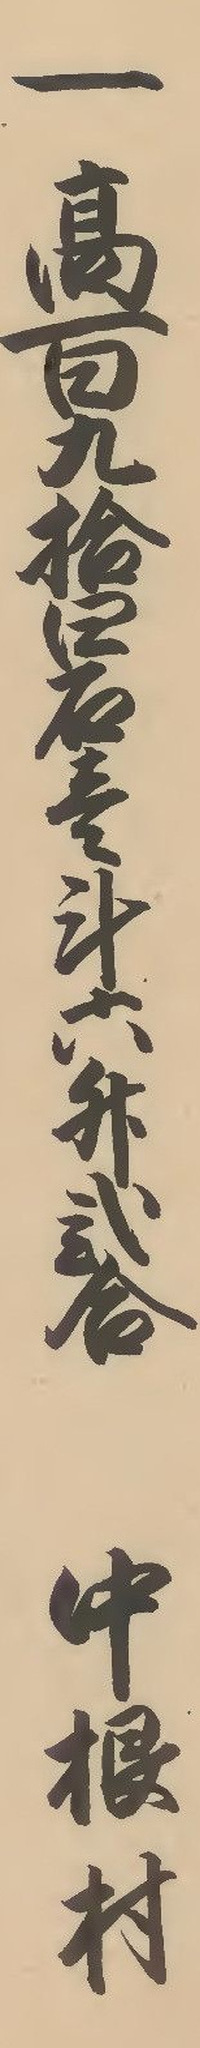一高百九拾四石壱斗六升弐合中根村
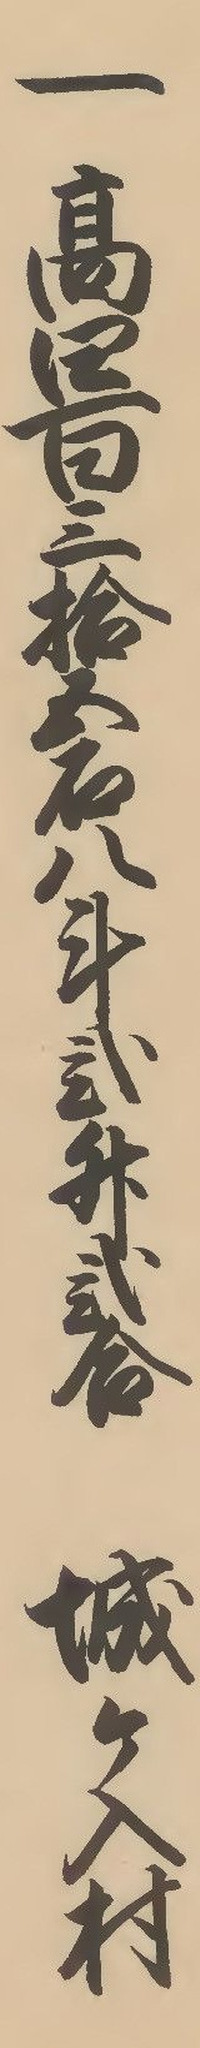一高四百三拾五石八斗弐升弐合城ヶ入村
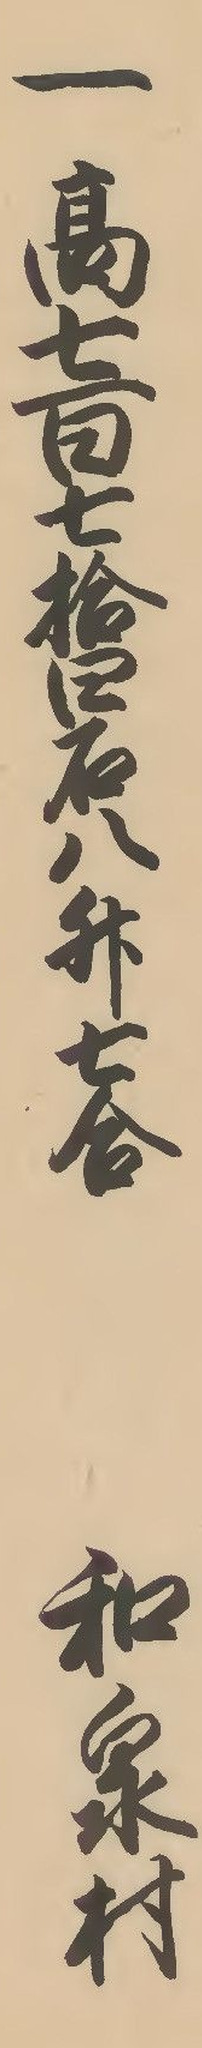一高七百七拾四石八升七合和泉村

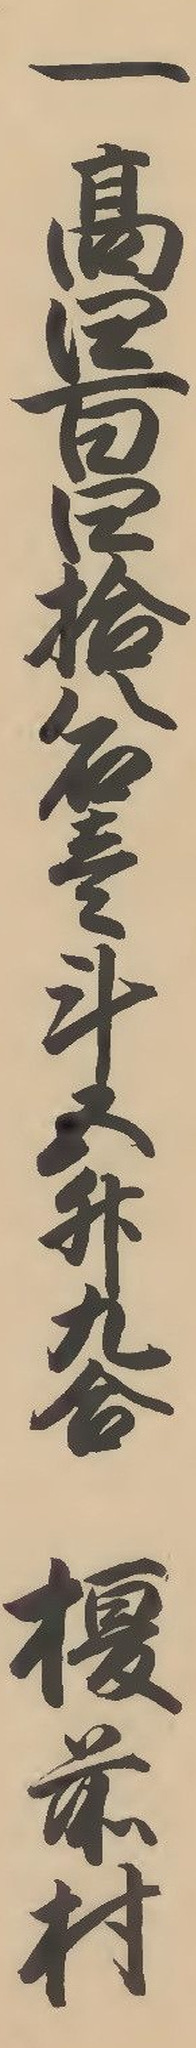一高四百四拾八石壱斗五升九合榎前村
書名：三河国郷帳
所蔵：国立公文書館 National Archives of Japan
